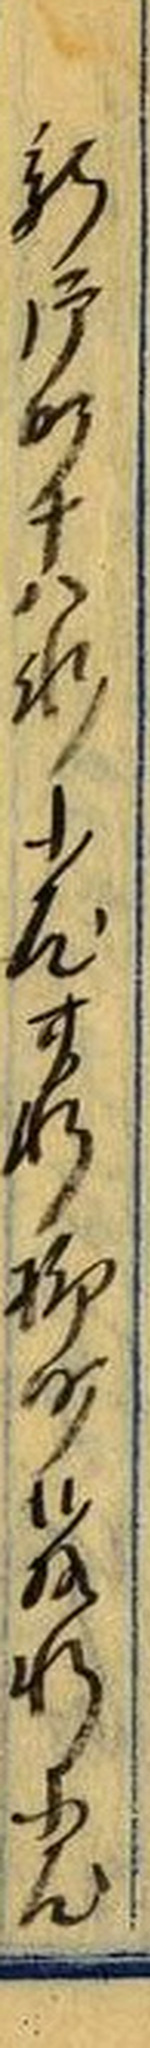新片町十八軒小屋廿軒柳町弐拾軒小屋
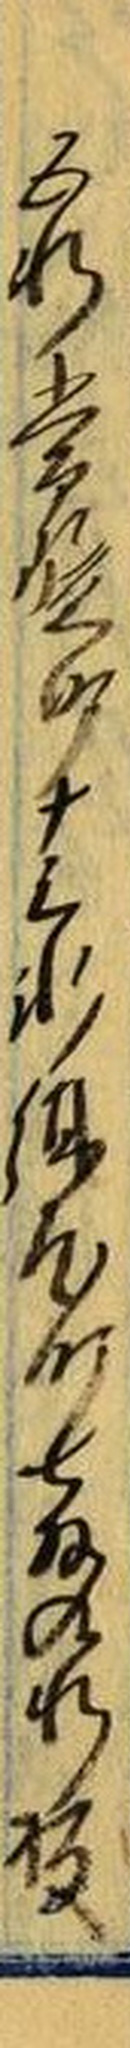五軒常盤町十三軒紺屋町七拾九軒板
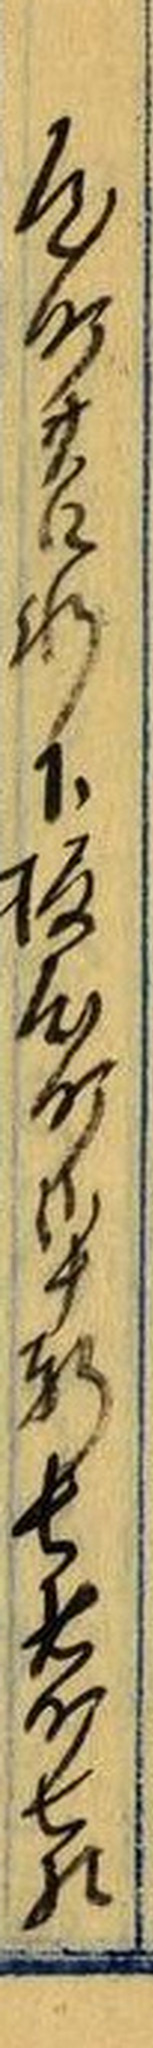屋町廿四軒下板屋町弐十軒長老町七拾
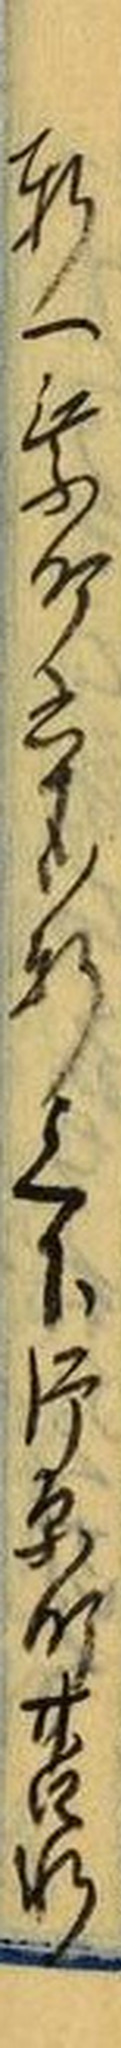軒一乗町六十弐軒上下片原町廿四軒
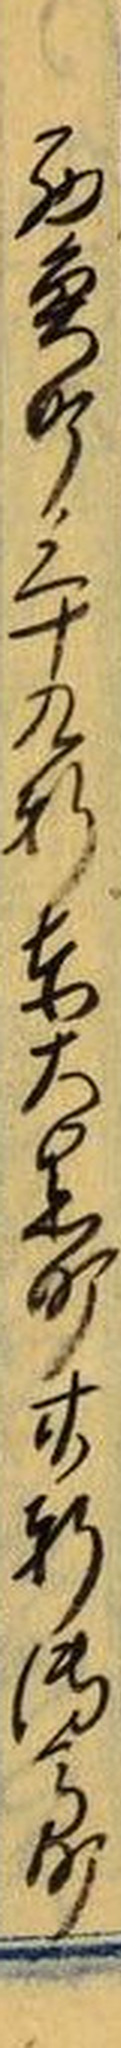西魚町三十九軒東大岩町廿軒伝馬町
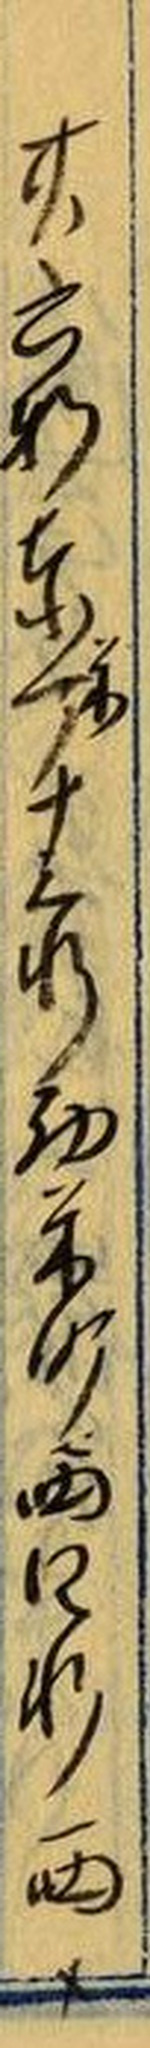廿六軒東米丁十三軒西米町西四軒西
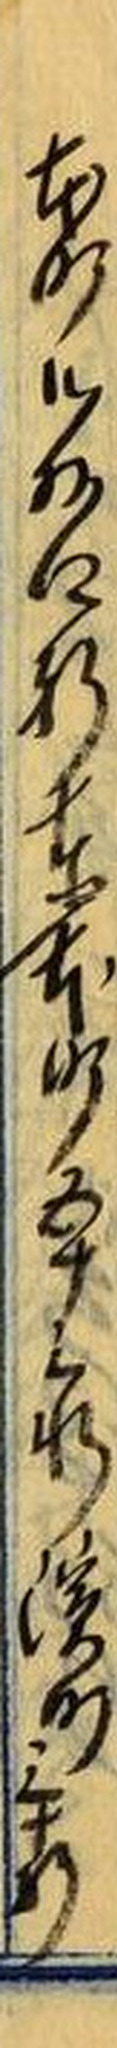本町弐拾四軒東本町五十三軒浜町三十軒
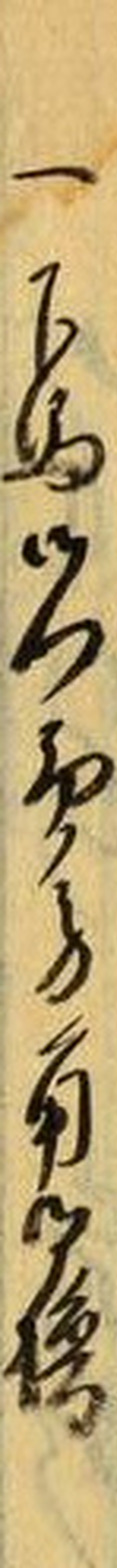一下馬御門卯ノ方角御櫓
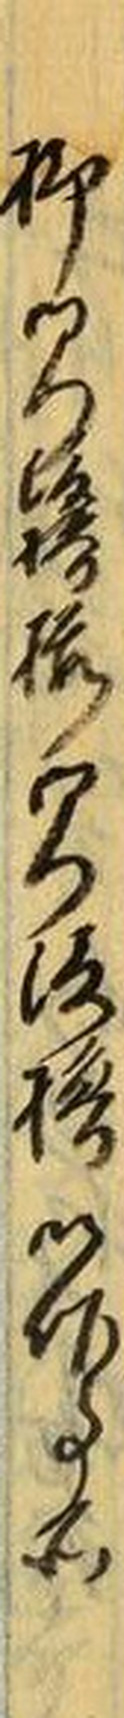柳御門後櫓桜御門後櫓御作事所
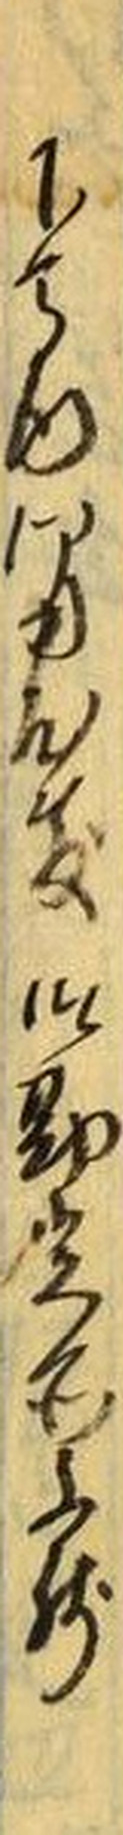下馬内御用屋敷御勘定所不残
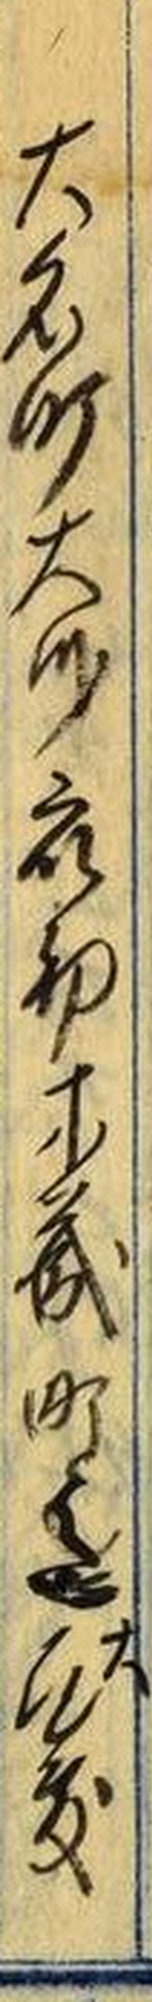大名町大身衆初木蔵町迄大屋敷
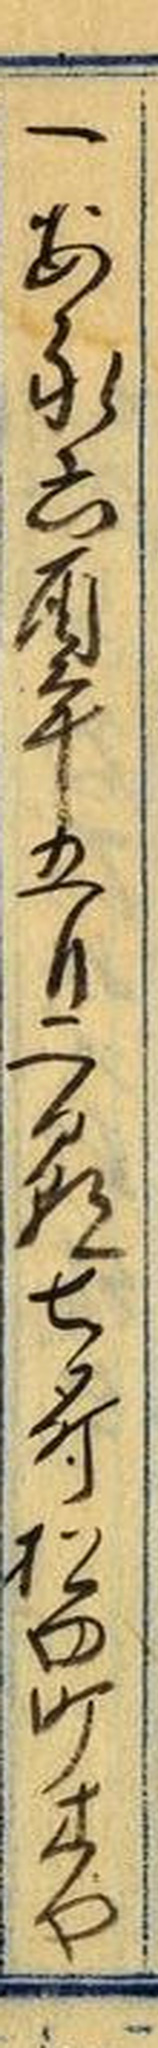一安永六酉年五月二日朝七ツ時松田町木や
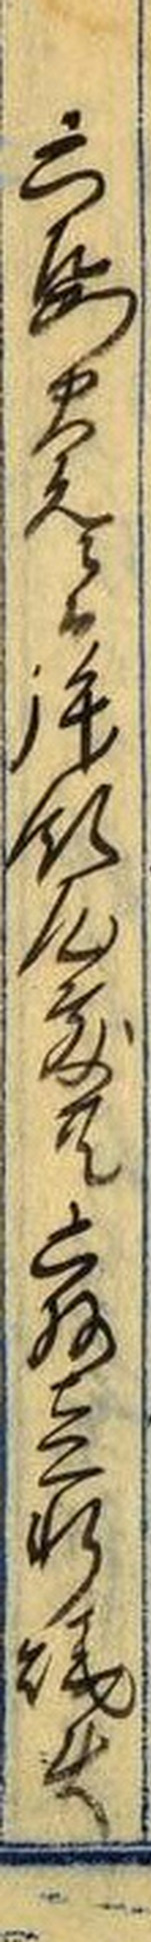六左衛門火元に而拝領屋敷共六拾壱軒焼失

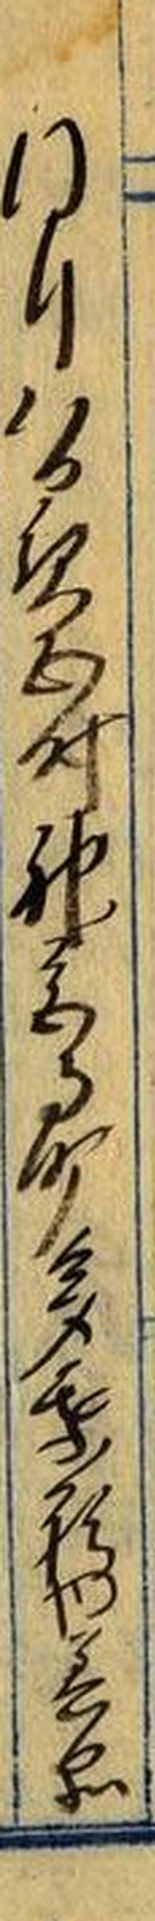同月八日夜五時神宮寺町多葉粉や善兵衛
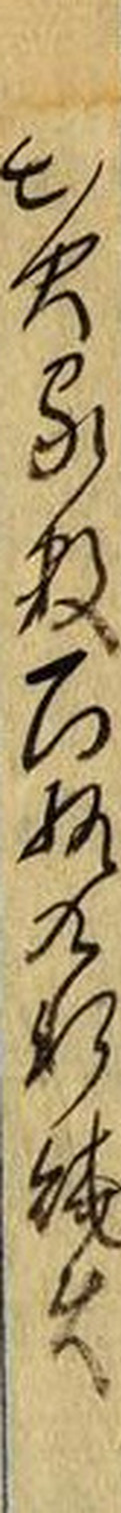出火家数百拾九軒焼失
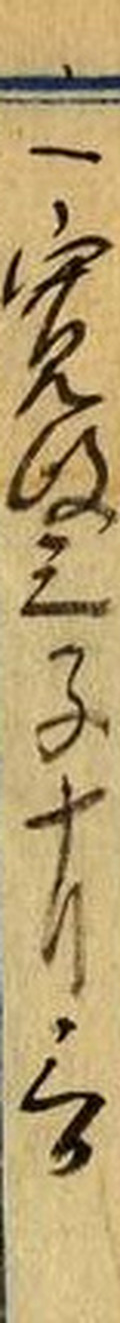一寛政三子十月三日
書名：温古集 五巻
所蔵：福井県文書館 Fukui Prefectural Archives
